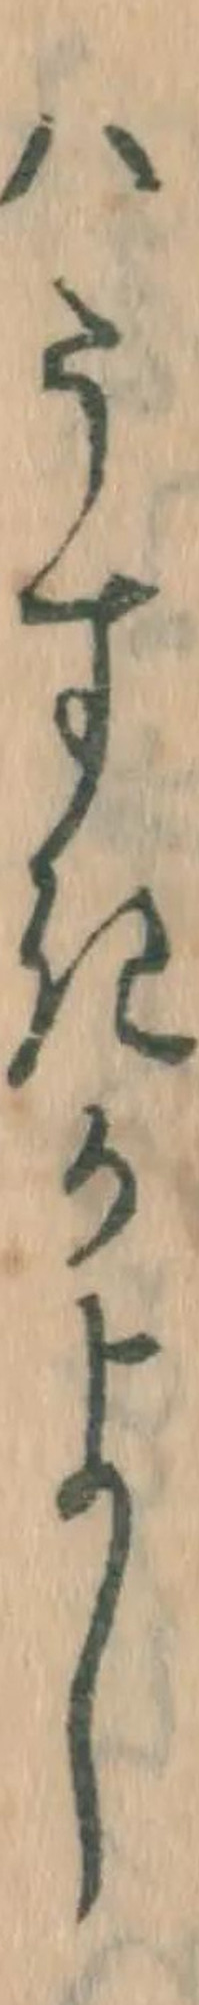はうすきかよし
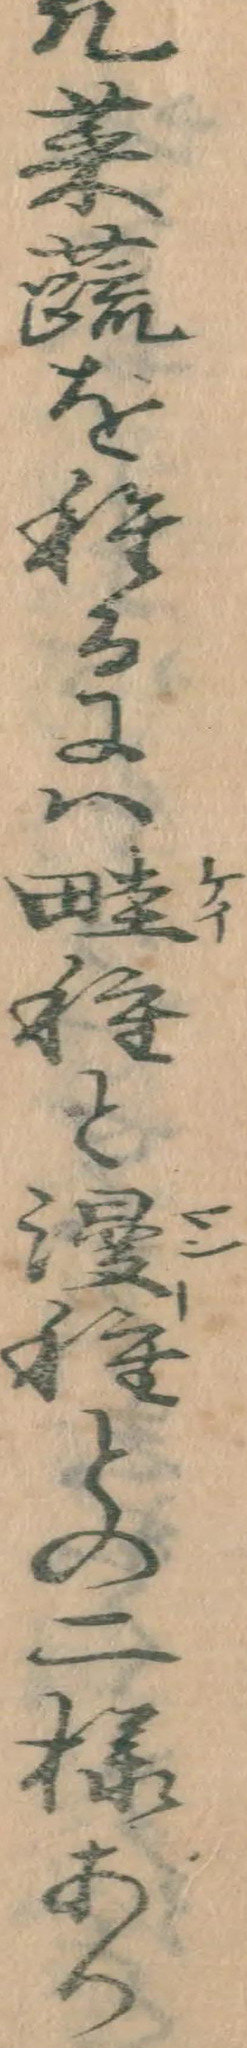凡菜蔬を種るには畦種と漫-種との二種あり
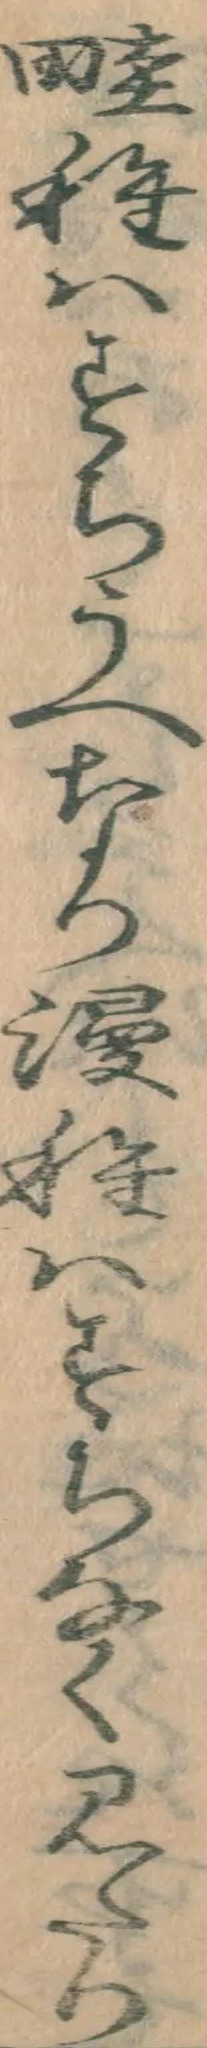畦種はすちうへなり漫種はすちなく見たり
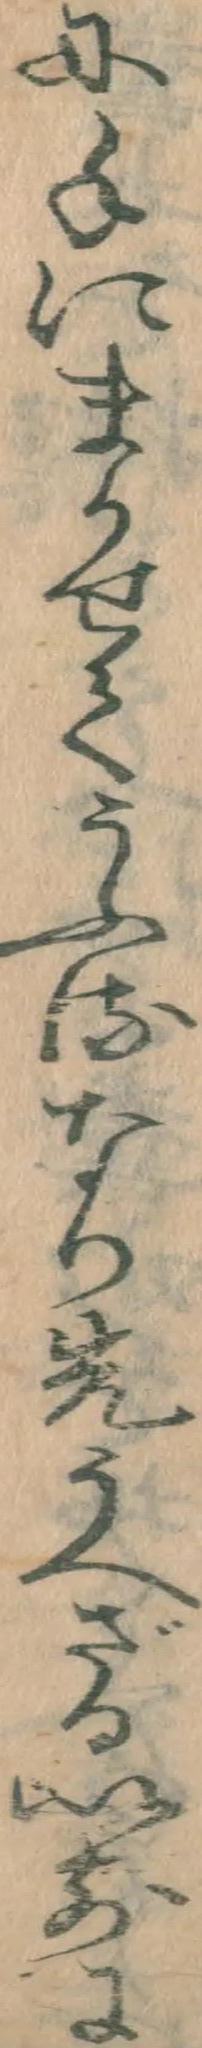に手にまかせてうふるなり先うへざる以前に
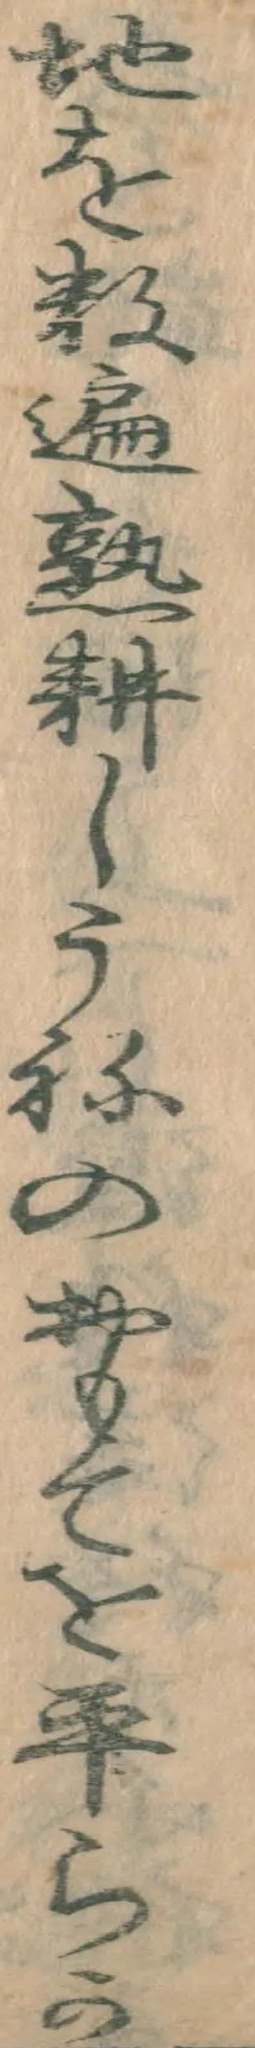地を数遍熟耕しうねのおもてを平らか
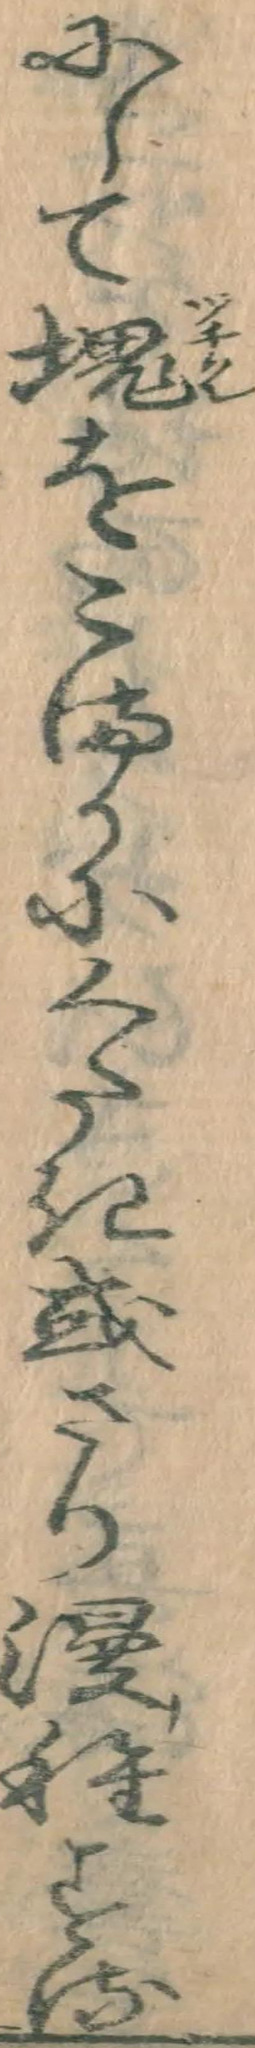にして塊をこまかにくたき或さり漫種する
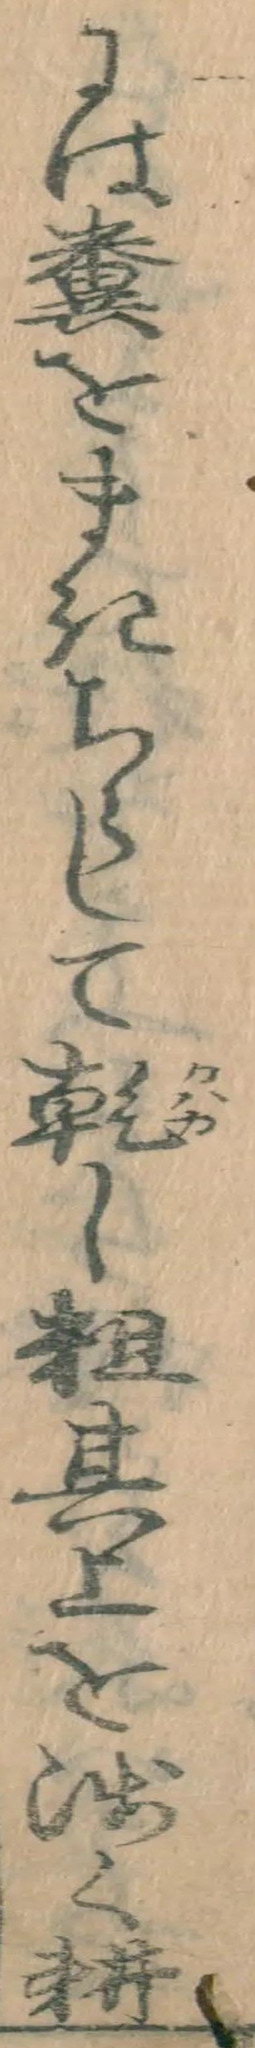には糞をまきちらして乾し粗其上を浅く耕

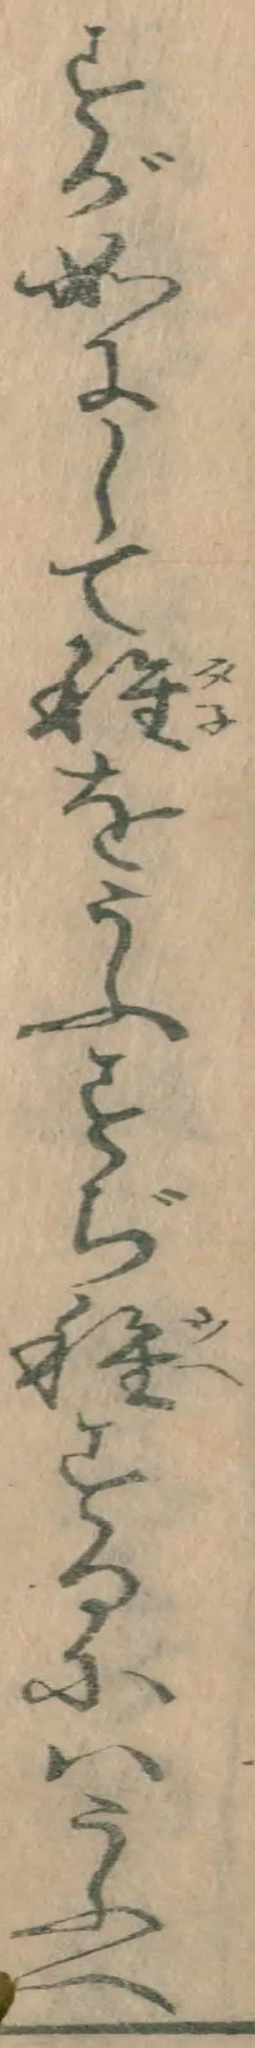すが如にして種をうふすぢ種するにはうふへ
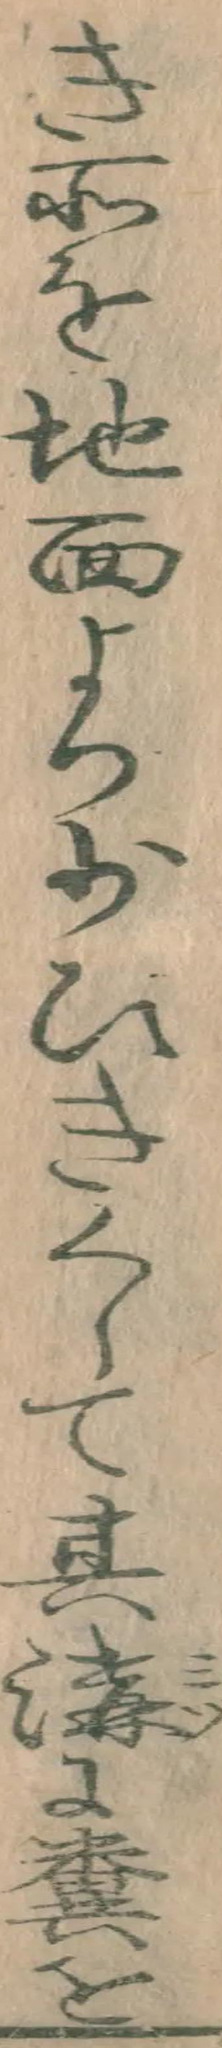き所を地面より少ひきくして其溝に糞を
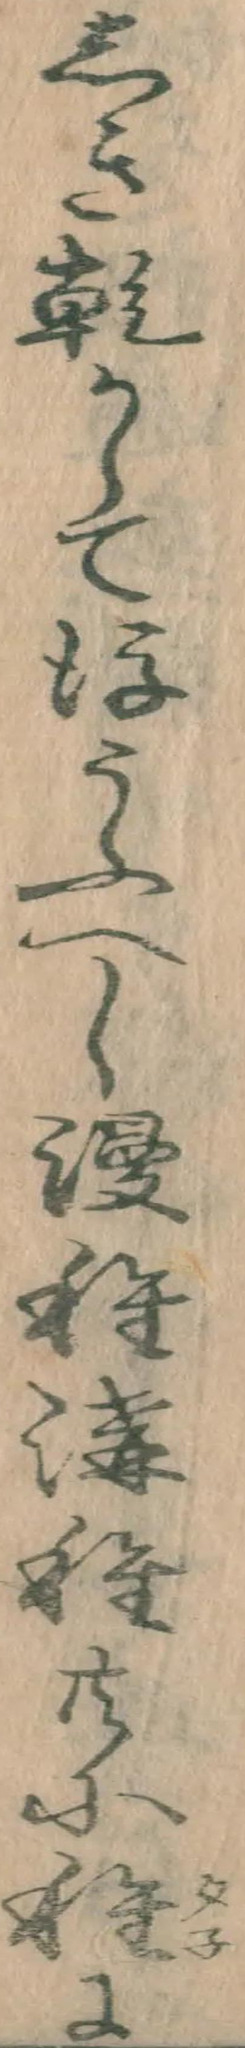しき乾かして後うふへし漫種溝種共に種に
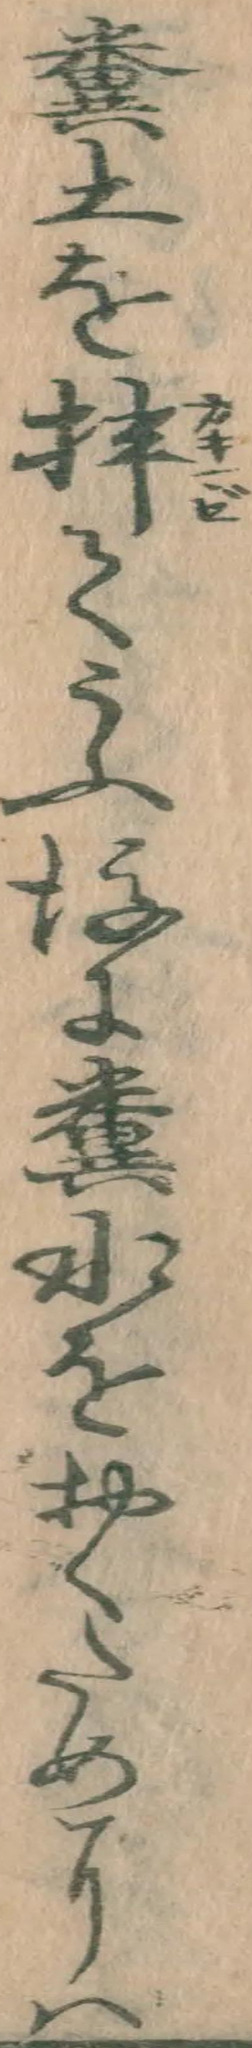糞土を拌てうふ後に糞水をおくためには
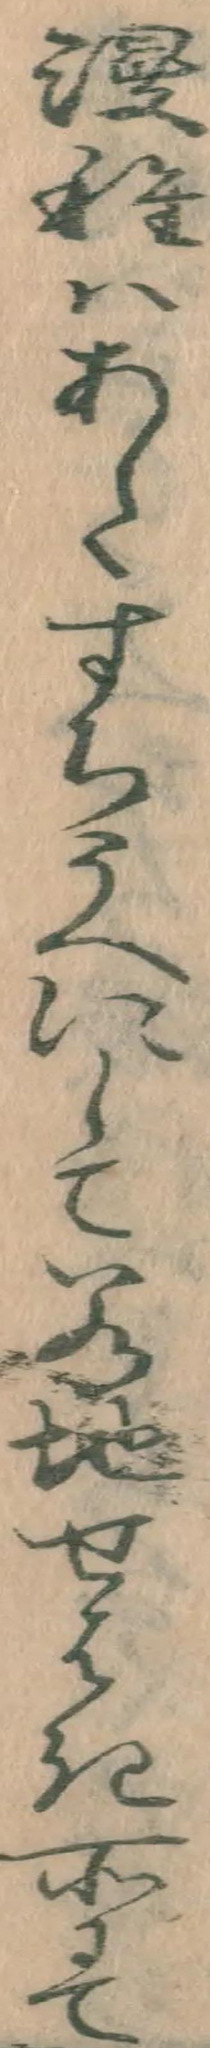漫種はあしくすちうへにして若地せはき所にて
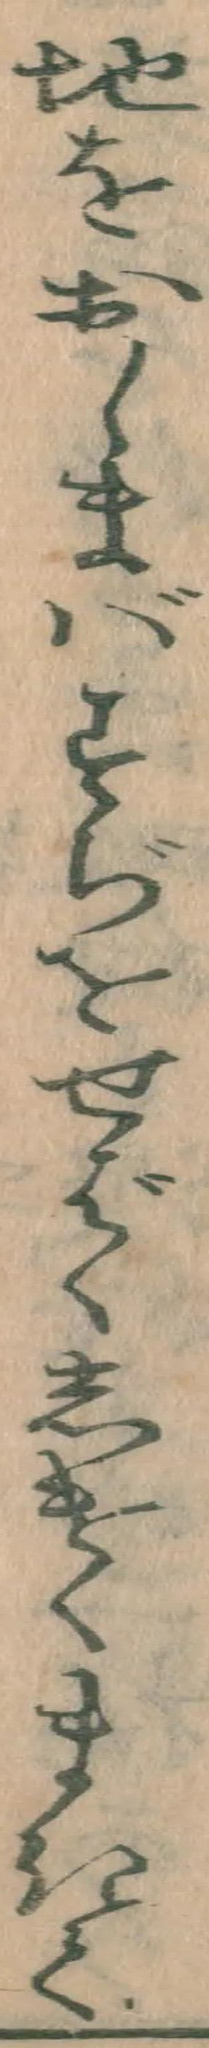地をおしまばすぢをせばくしけくまきて
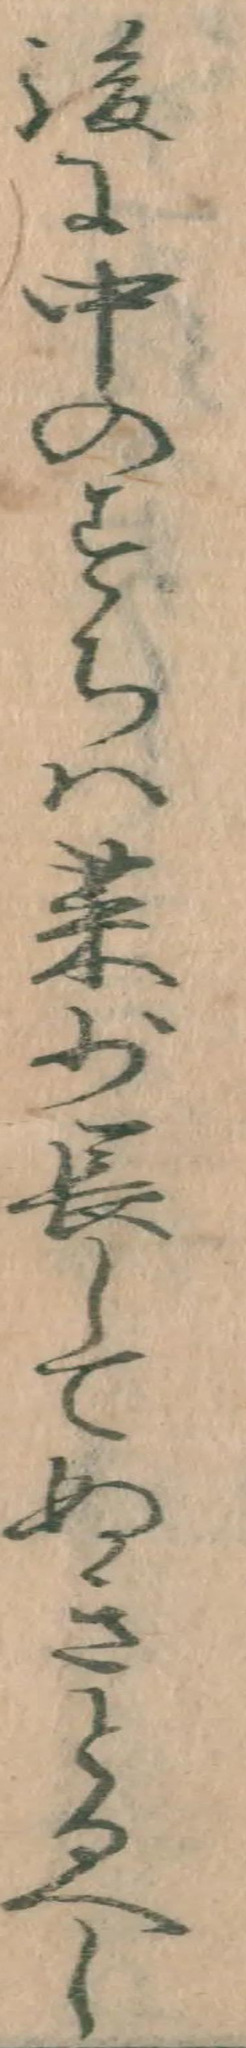後に中のすちは菜少長してぬきとるへし
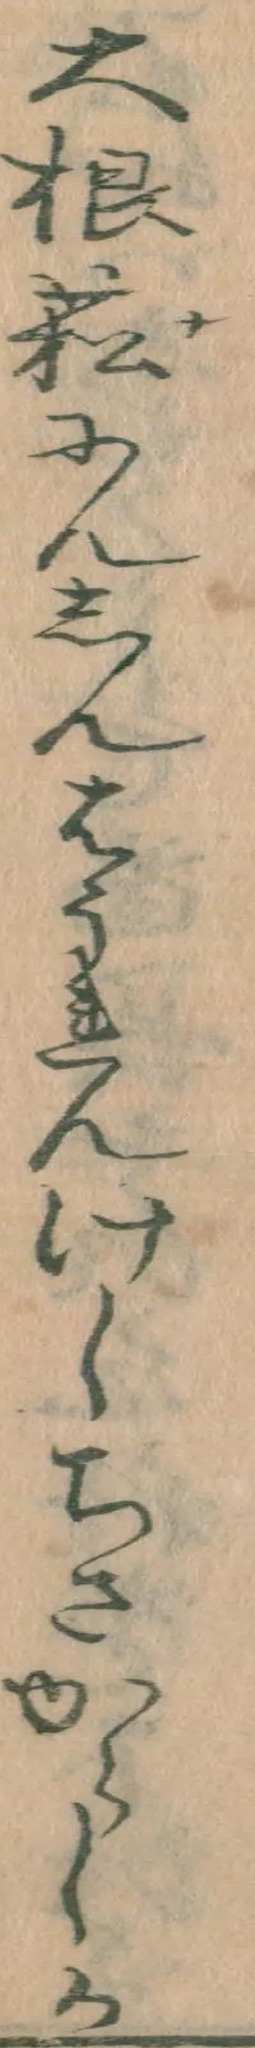大根菘にんしんはうれんけしちさからしか
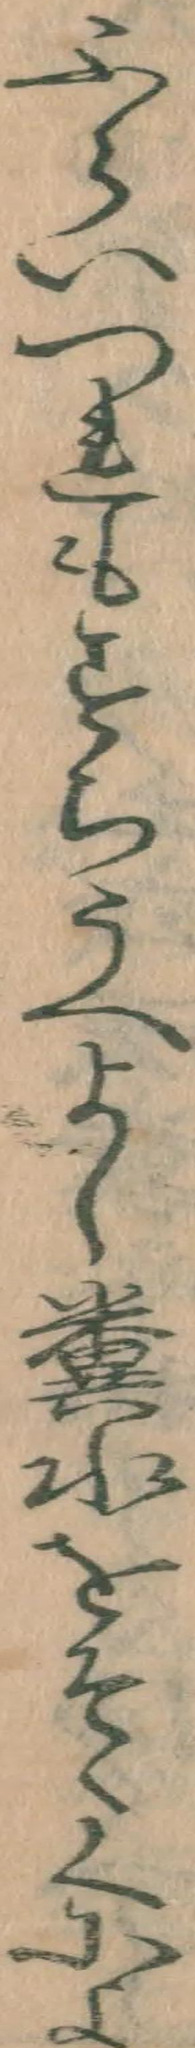ふらいつれもすちうへよし糞水をそゝくによ
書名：菜譜 3巻
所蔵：国立国会図書館 National Diet Library, JAPAN
